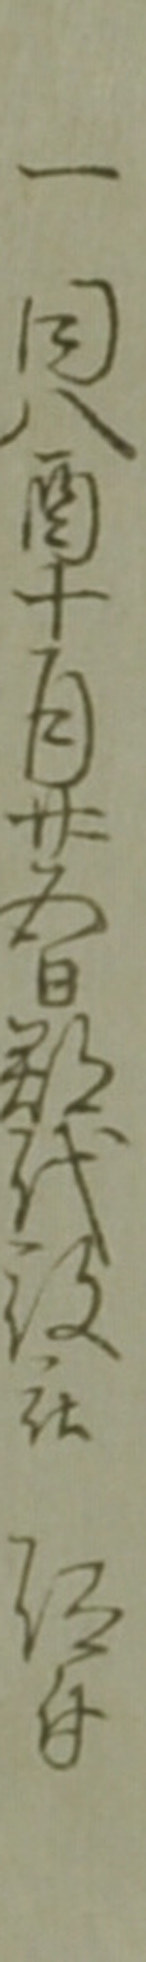一同八酉十月廿五日郡代役被仰付
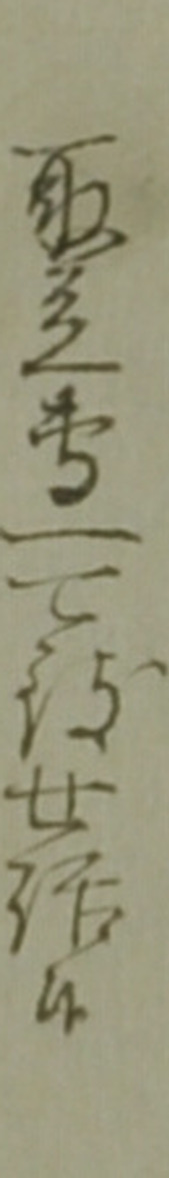取立専一可致世話候
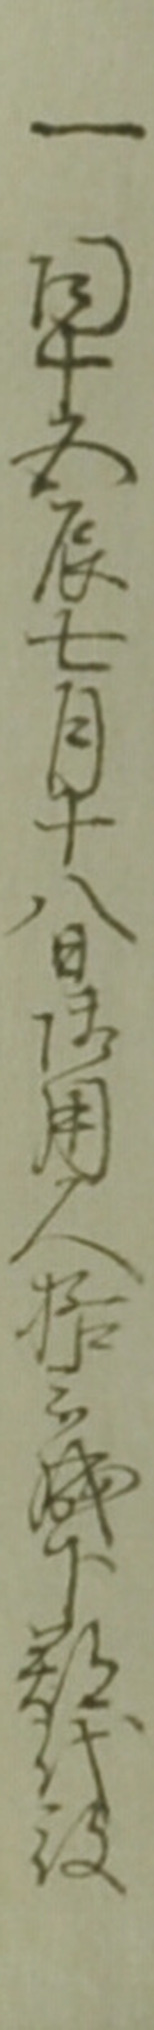一同十五辰七月十八日御用人格被成下郡代役
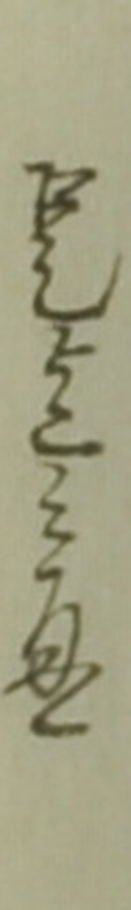是迄之通

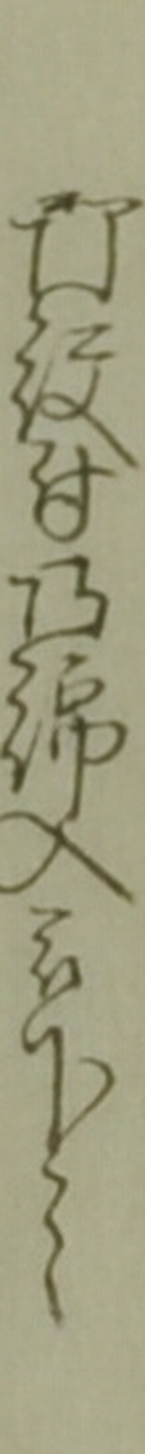御紋付御綿入被下之
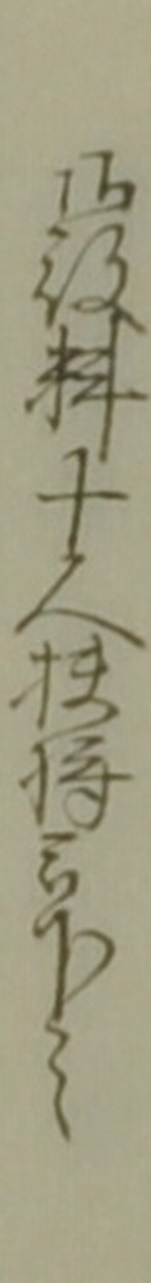御役料十人扶持被下之

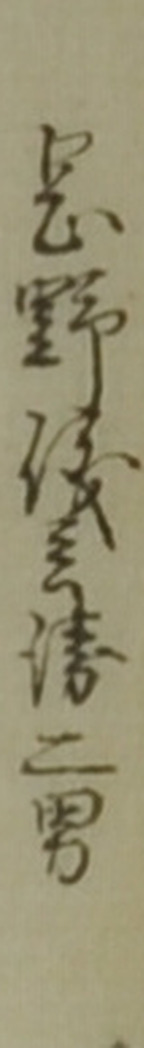岡野儀兵衛二男
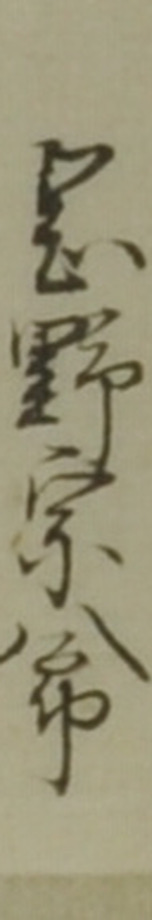岡野宗八郎
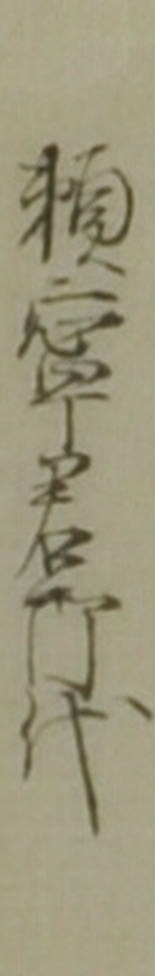頼寧君御代
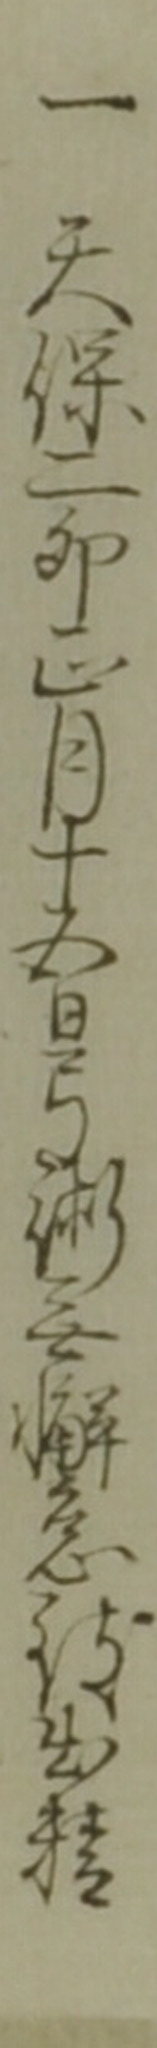一天保二卯正月十五日弓術無懈怠致出精
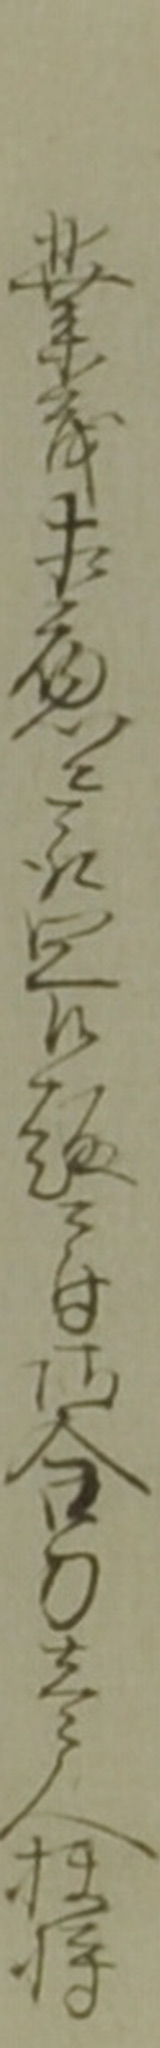業抔茂相応ニ取廻候趣ニ付御合力壱人扶持ニ
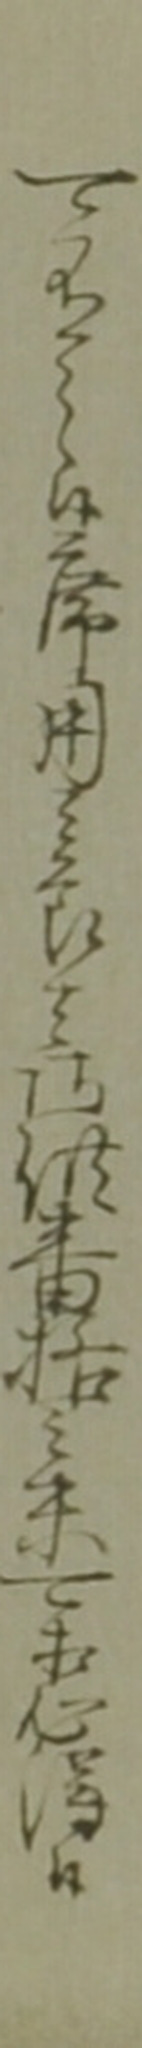可有之候間席用之節者御供番格之末可相心得候
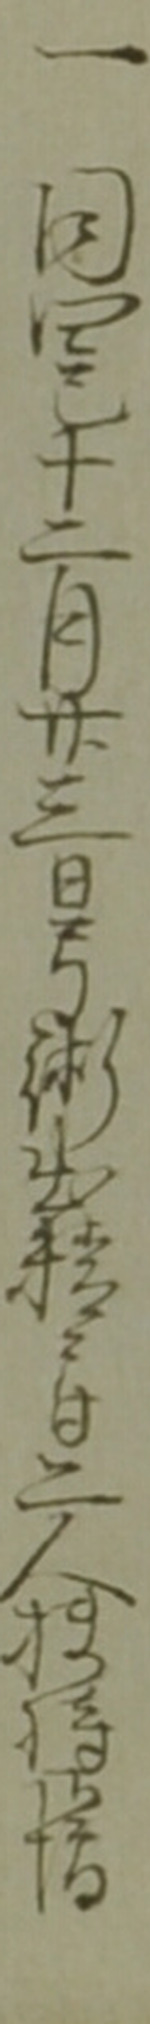一同四己十二月廿三日弓術出精ニ付二人扶持御情
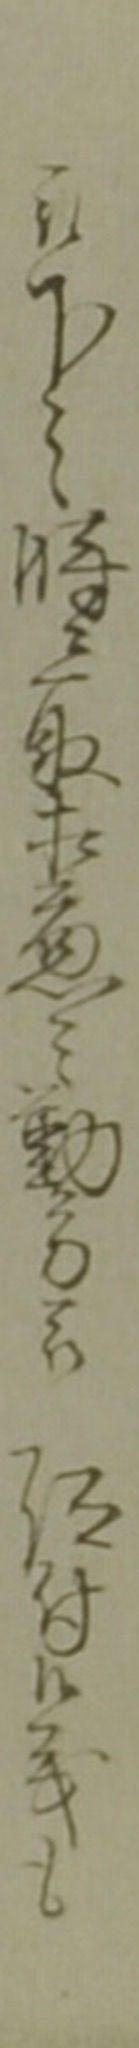被下候時ニ取相応之勤方被仰付候義茂
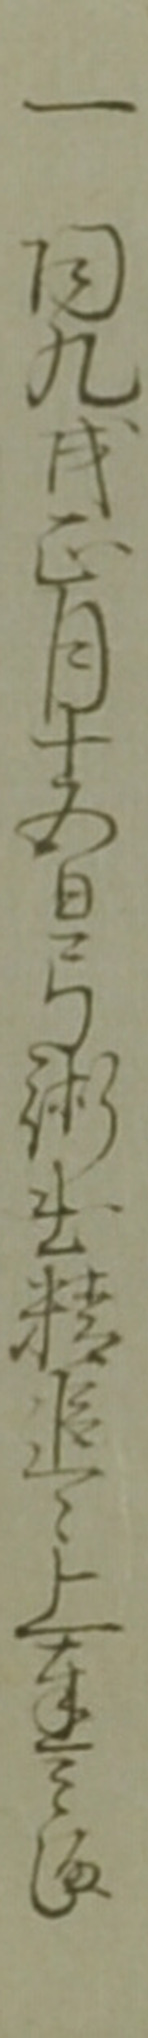一同九戊正月十五日弓術出精追々上達之趣
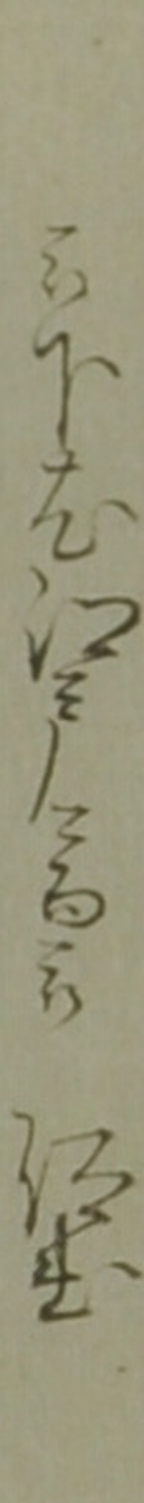被下尤江戸ニ而被仰出
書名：給人諸士勤仕録（三）
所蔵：伊那市立高遠町図書館・合同会社AMANE
